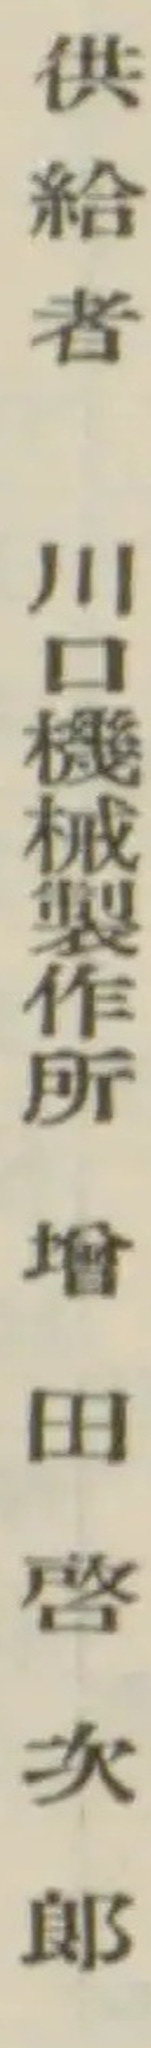供給者川口機械製作所增田啓次郎
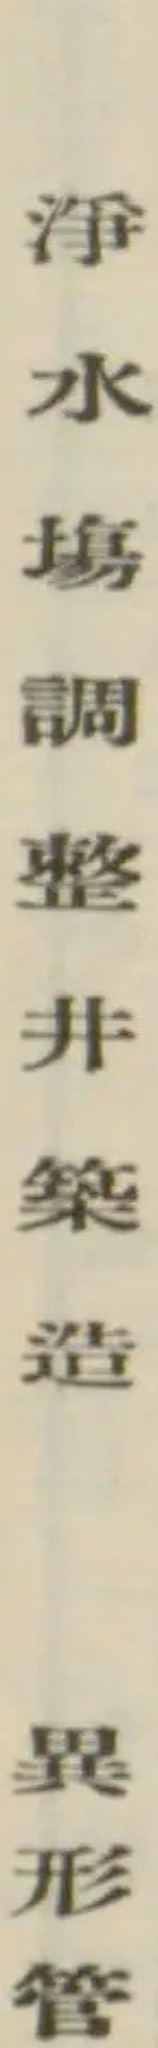浄水場調製井築造異形管

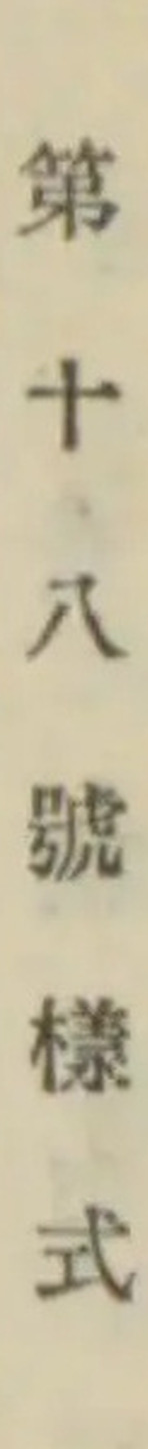第十八号様式
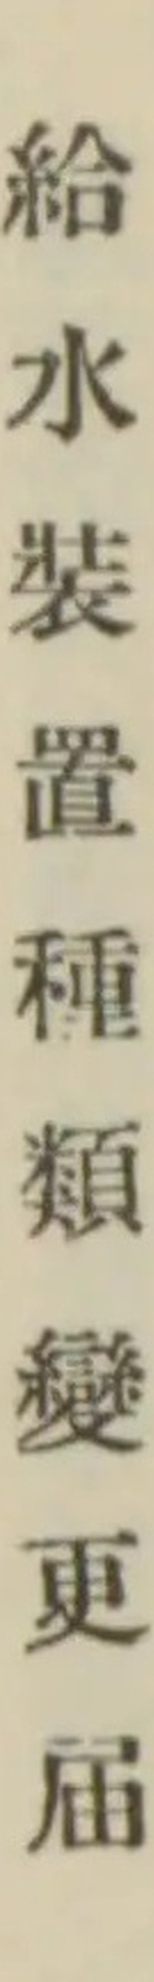給水装置種類変更届
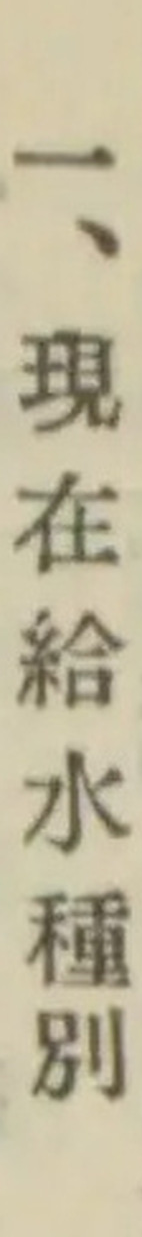一、現在給水種別
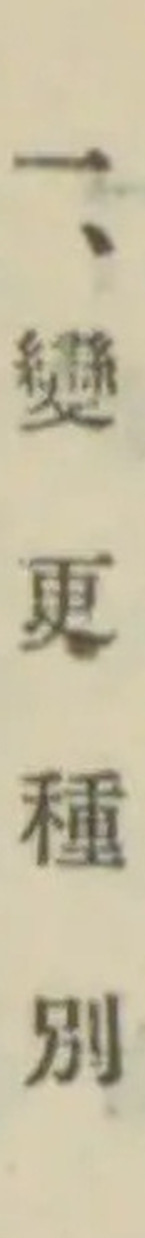一、変更種別
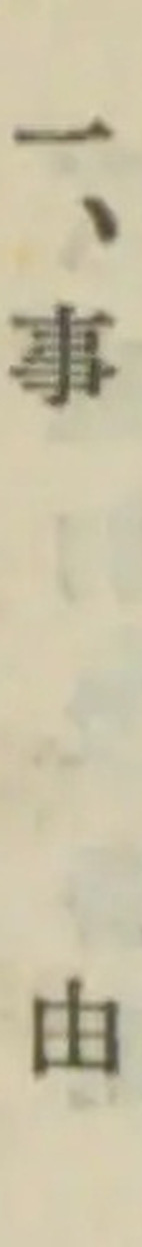一、事由
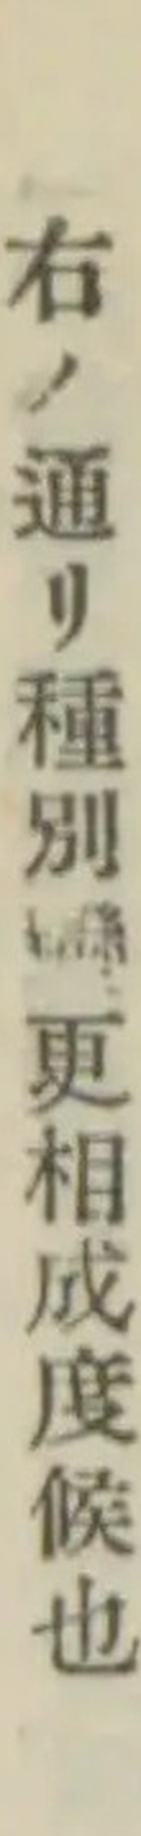右ノ通リ種別変更相成度候也
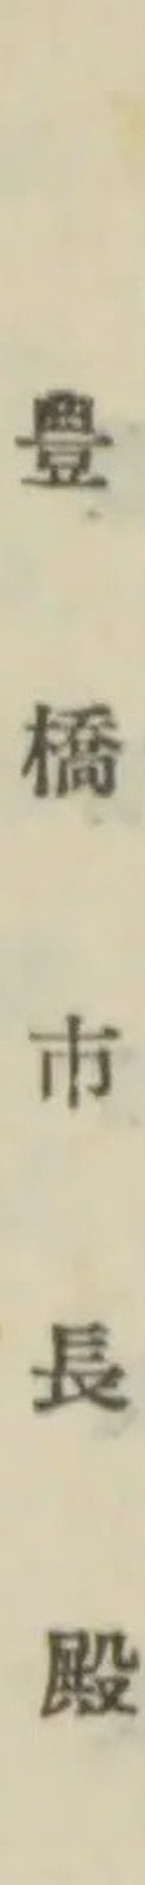豊橋市長殿
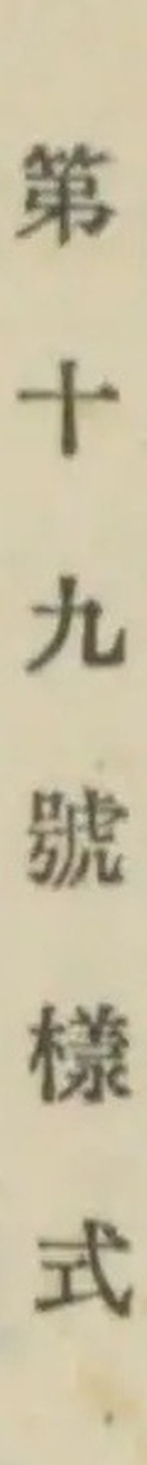第十九号様式
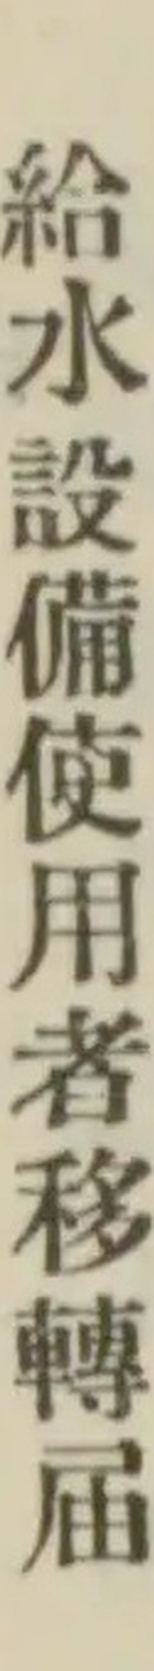給水設備使用者移転届
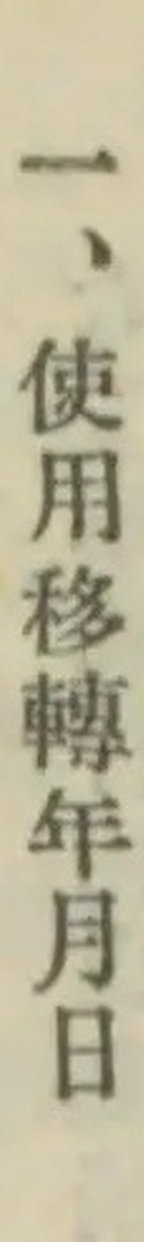一、使用移転ノ事由
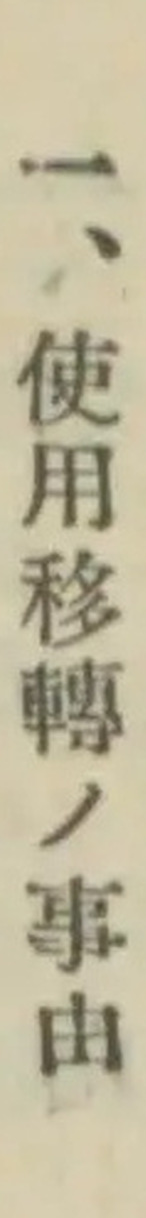一、使用移転ノ事由
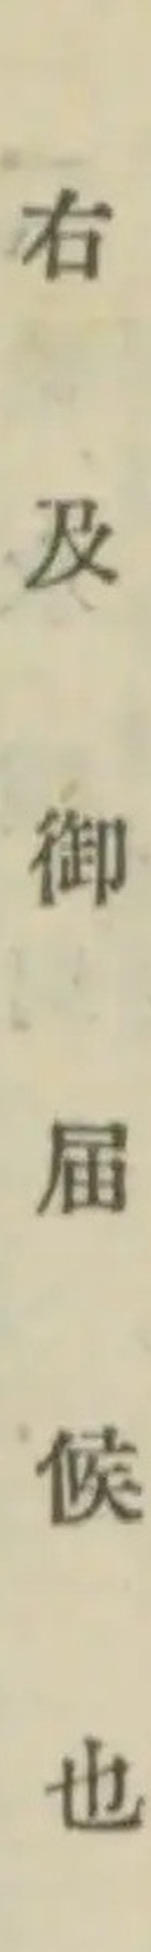右及御届候也
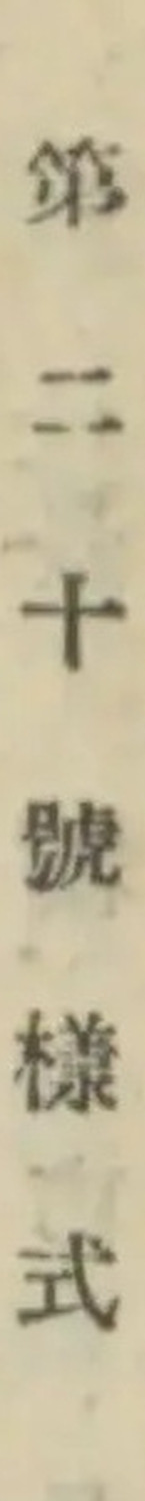第二十号様式
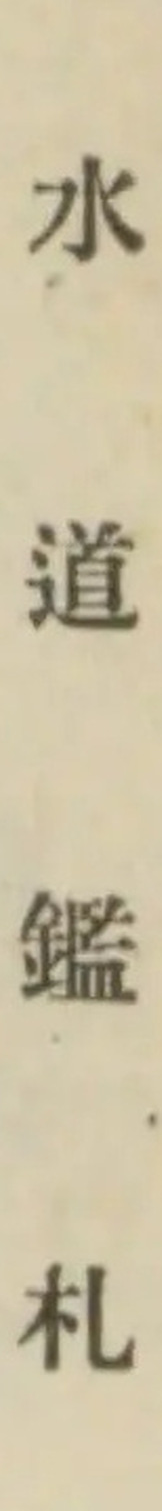水道鑑札
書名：豊橋市水道誌
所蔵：国立国会図書館 National Diet Library, JAPAN
